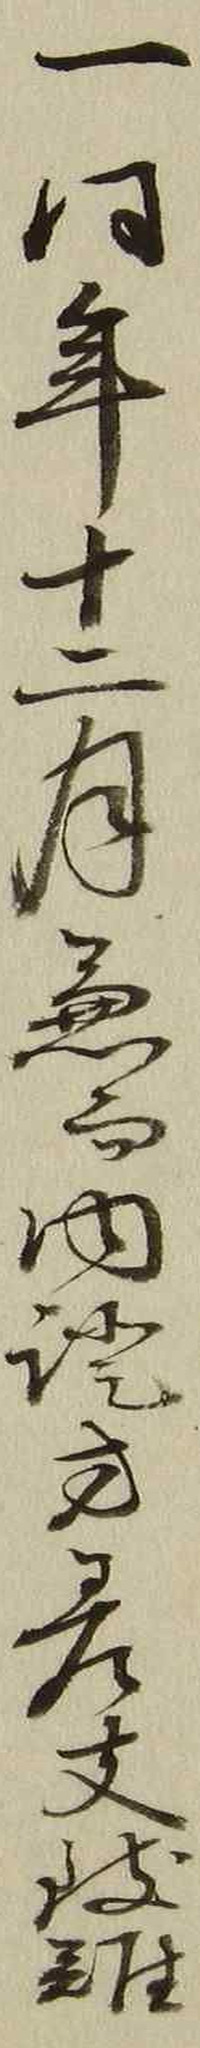一同年十二月兼而内証方差支致難
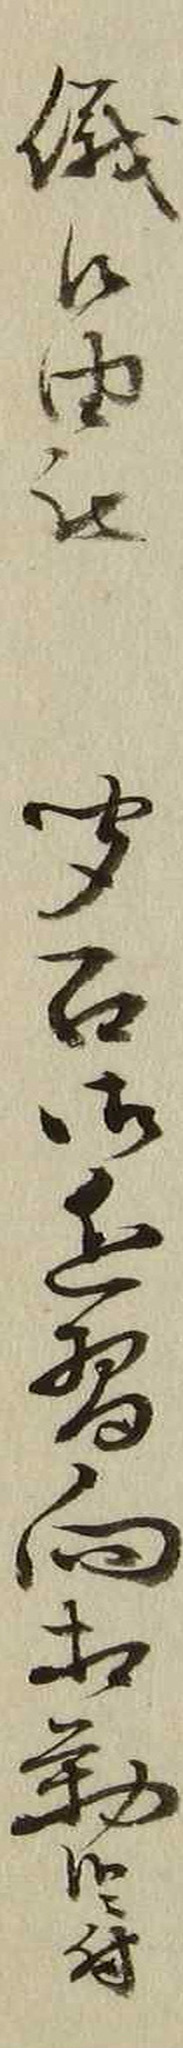儀候由被聞召御近習向相勤候ニ付
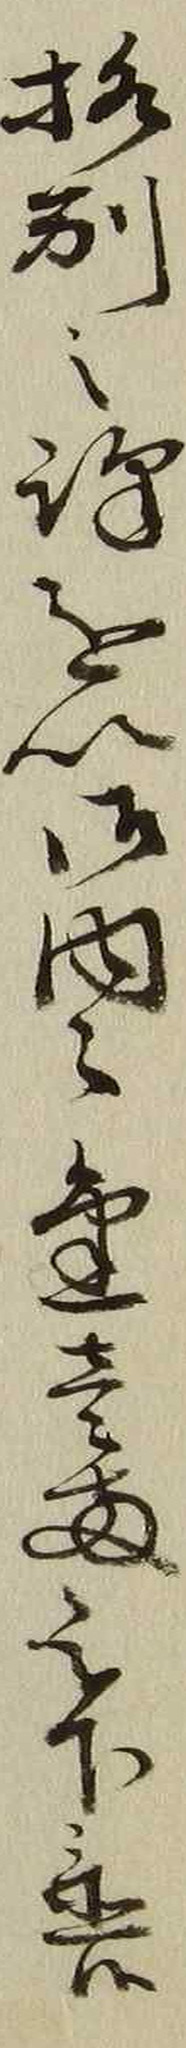格別之訳を以御内々金壱両被下置候
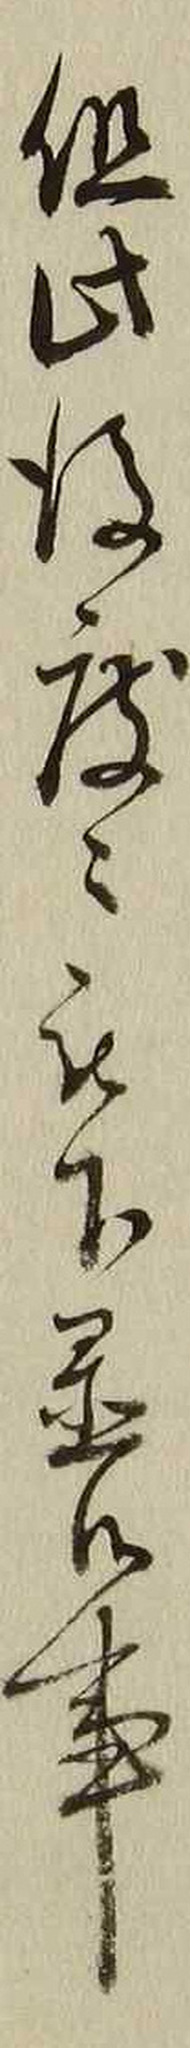但此後度々被下置候事
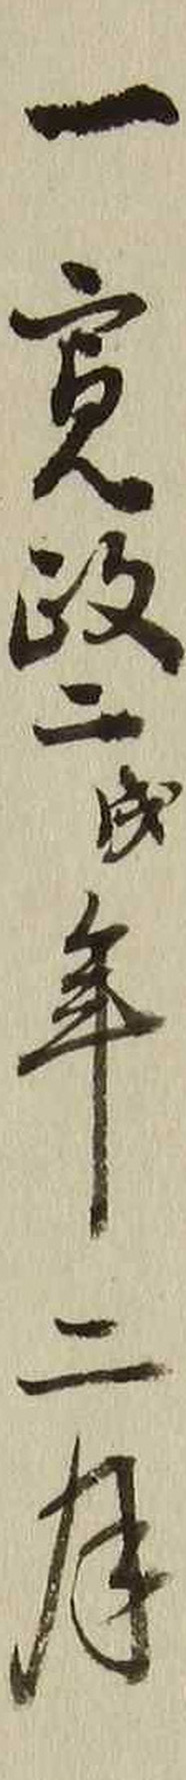一寛政二戌年二月
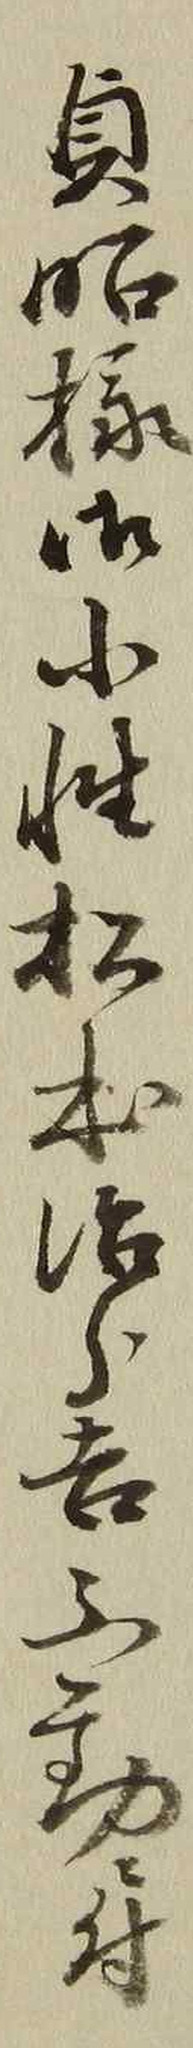貞昭様御小性松本治郎吉不勤ニ付
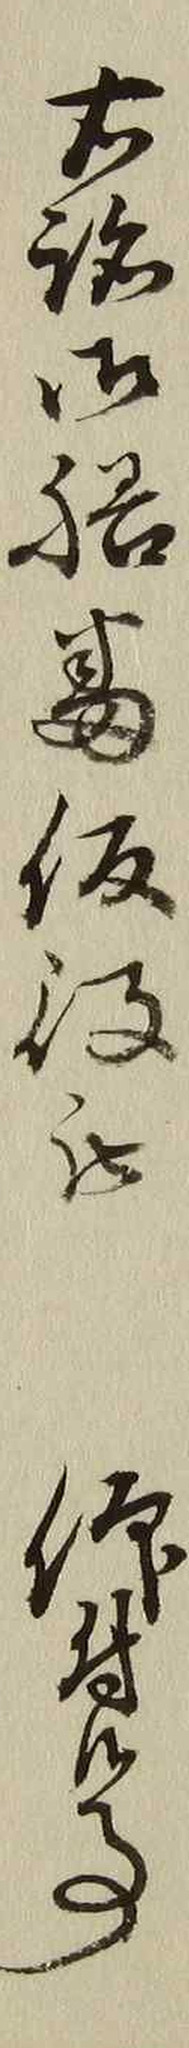右跡御膳番仮役被仰付候事
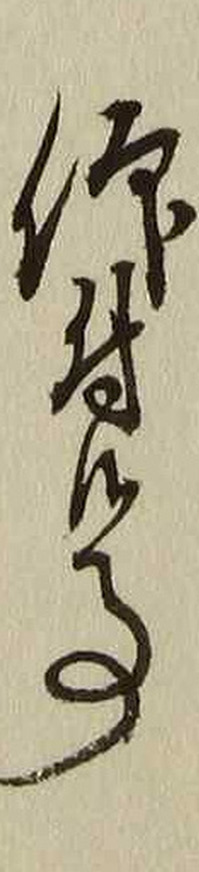仰付候事
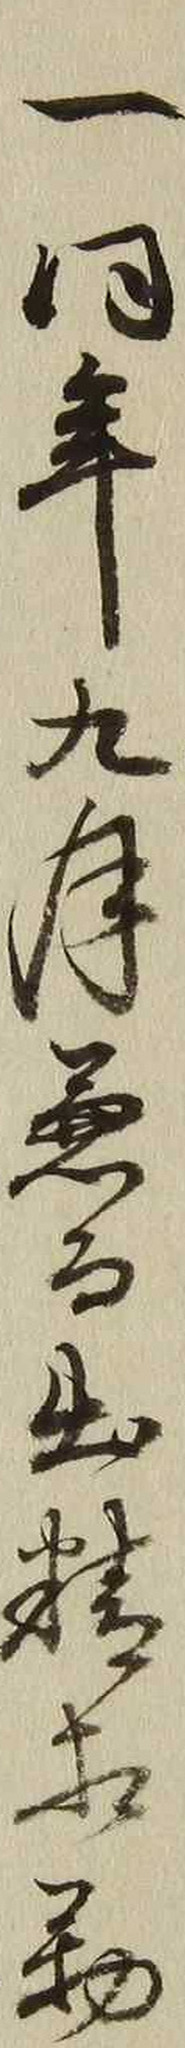一同年九月兼而出精相勤
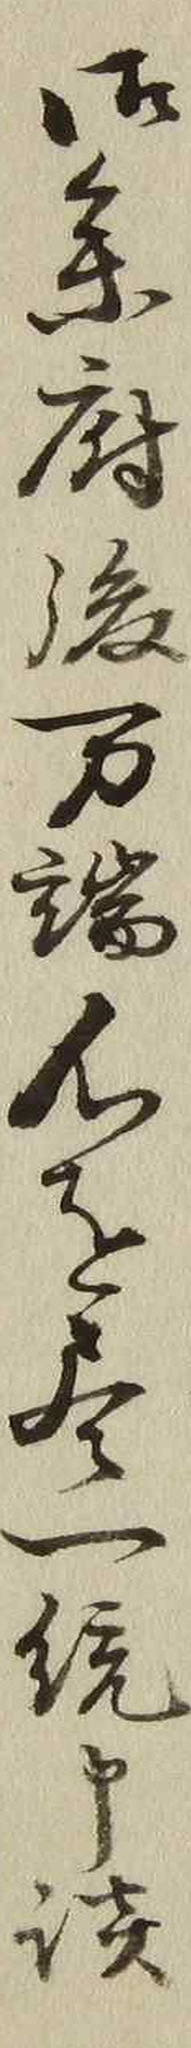御参府後万端心を尽一統申談
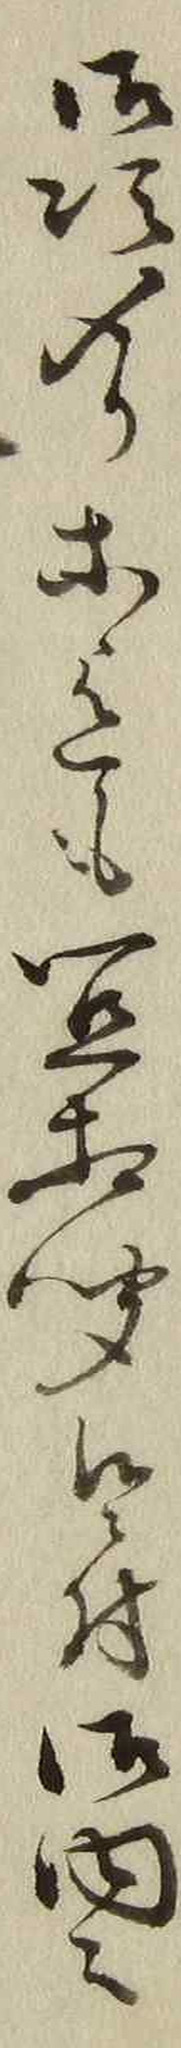御次〆り等迄も宜相聞候ニ付御内々
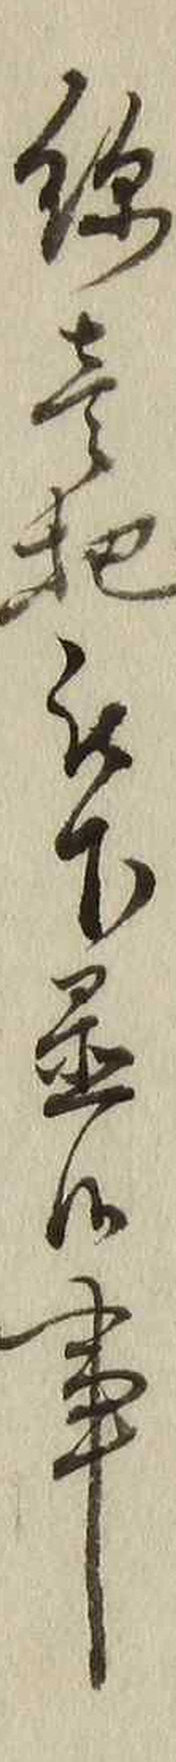綿壱把被下置候事
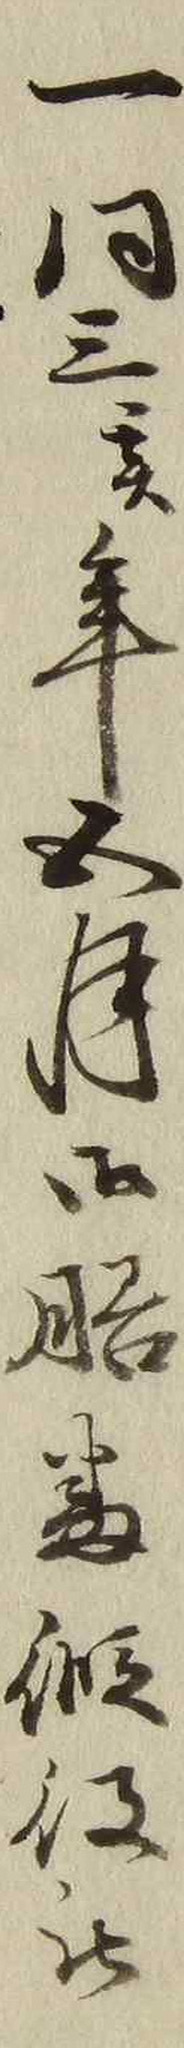一同三亥年五月御膳番仮役被
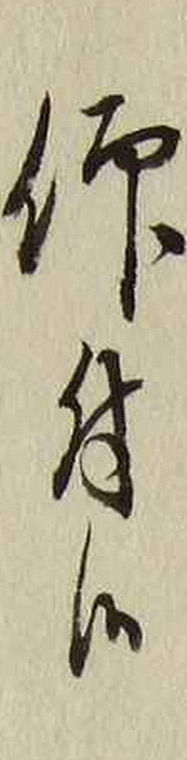仰付候
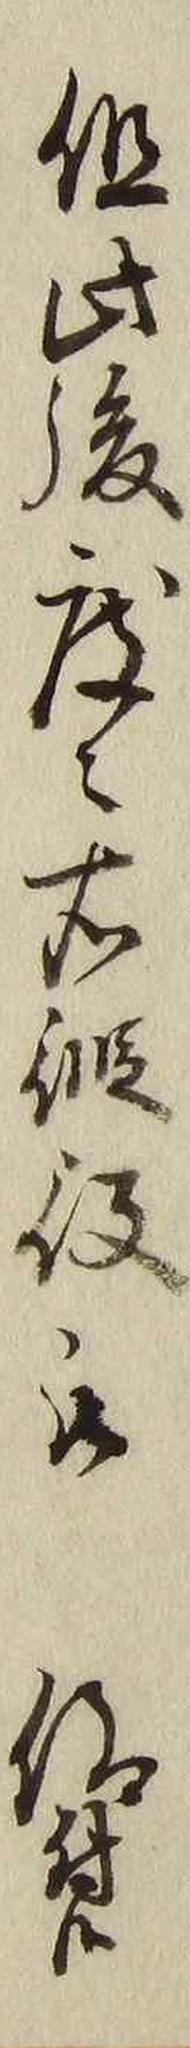但此後度々右仮役被仰付候
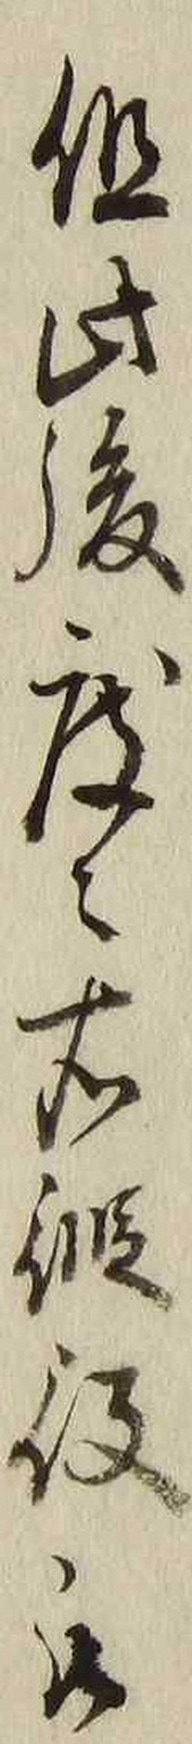但此後度々右仮役被仰付候
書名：諸士系譜　巻之35　は之部3
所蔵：会津若松市立会津図書館
